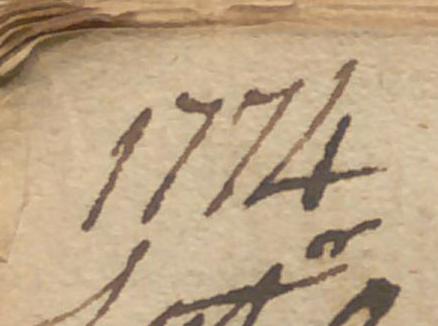1774
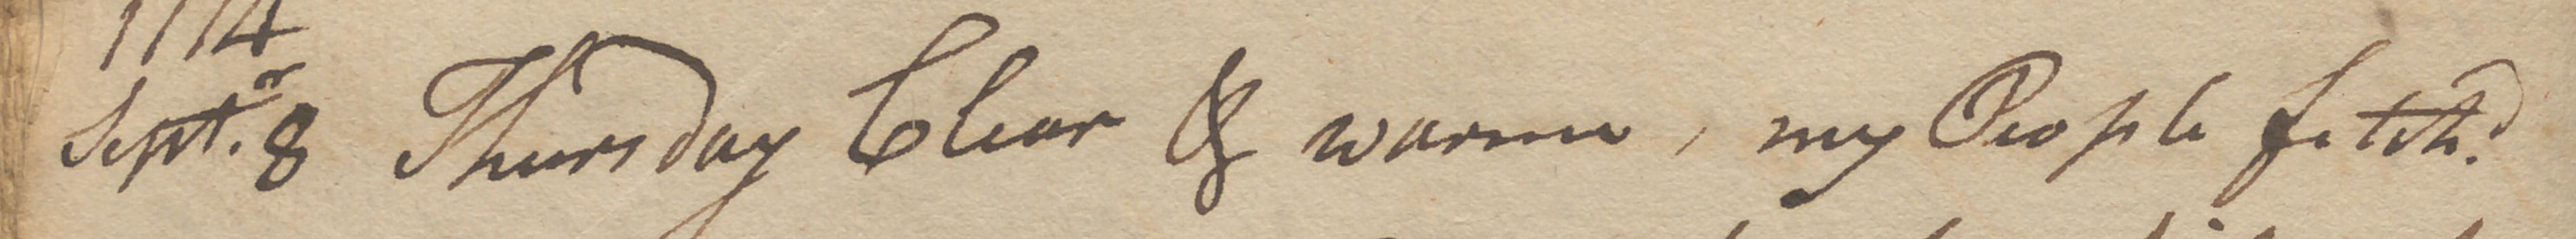Sept^r. 8 Thursday Clear & warme, my People fetch^d.
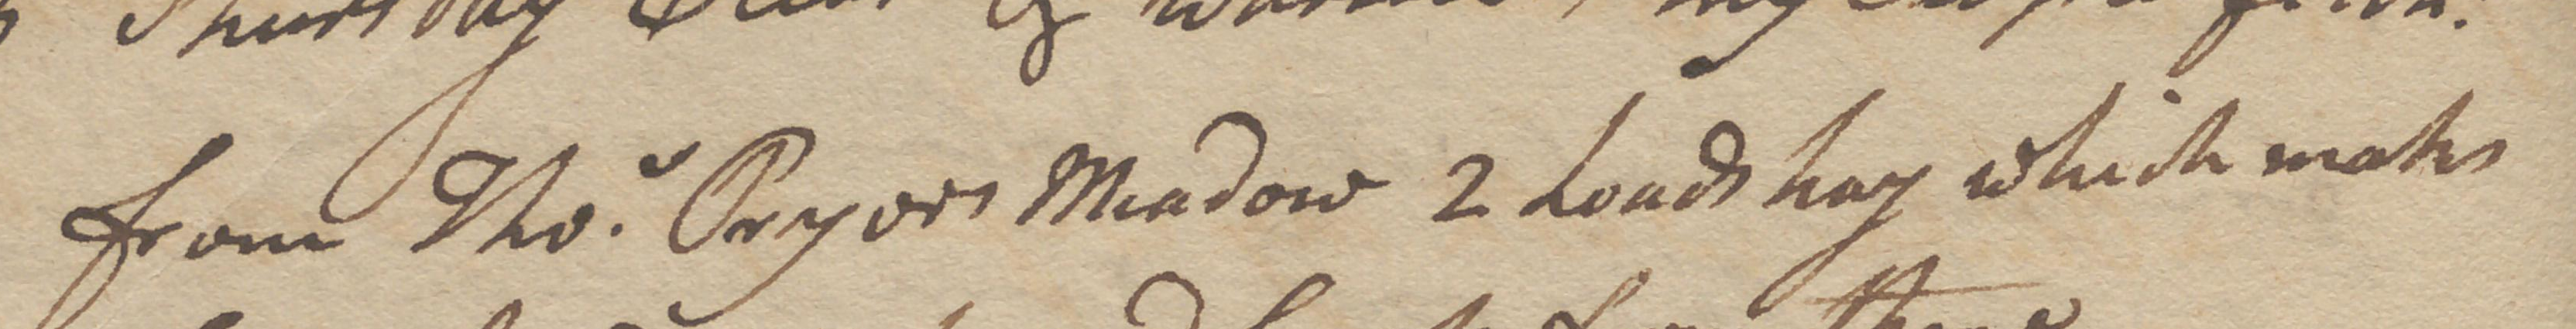from Tho^s. Pryors Meadow 2 Loads hay which maks
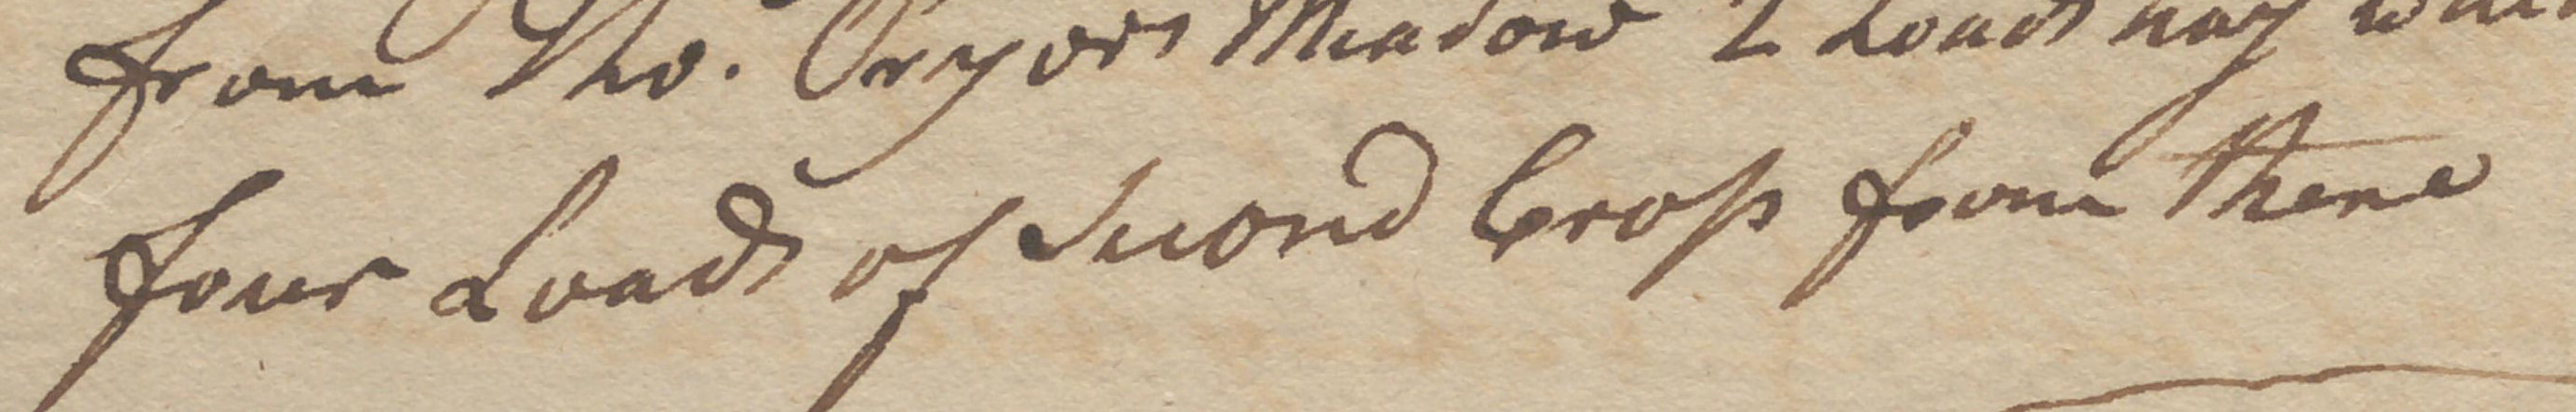four Loads of second Crop from there
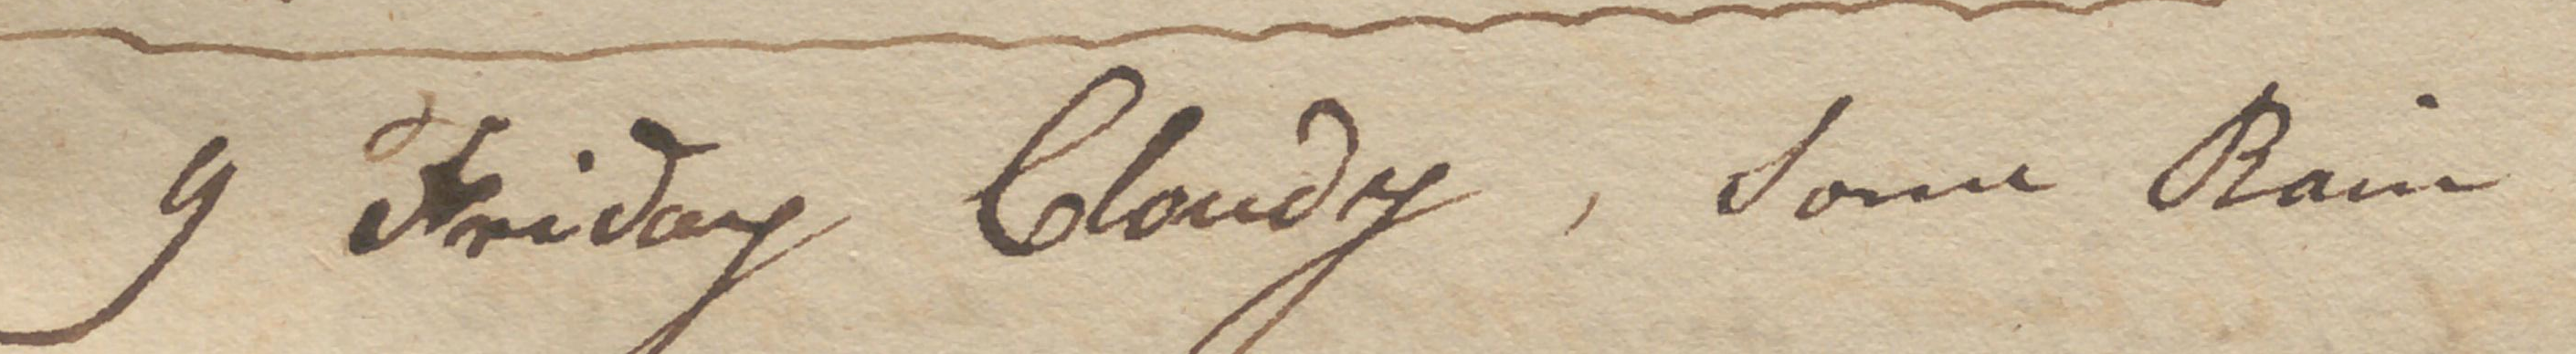9 Friday Cloudy, some Rain
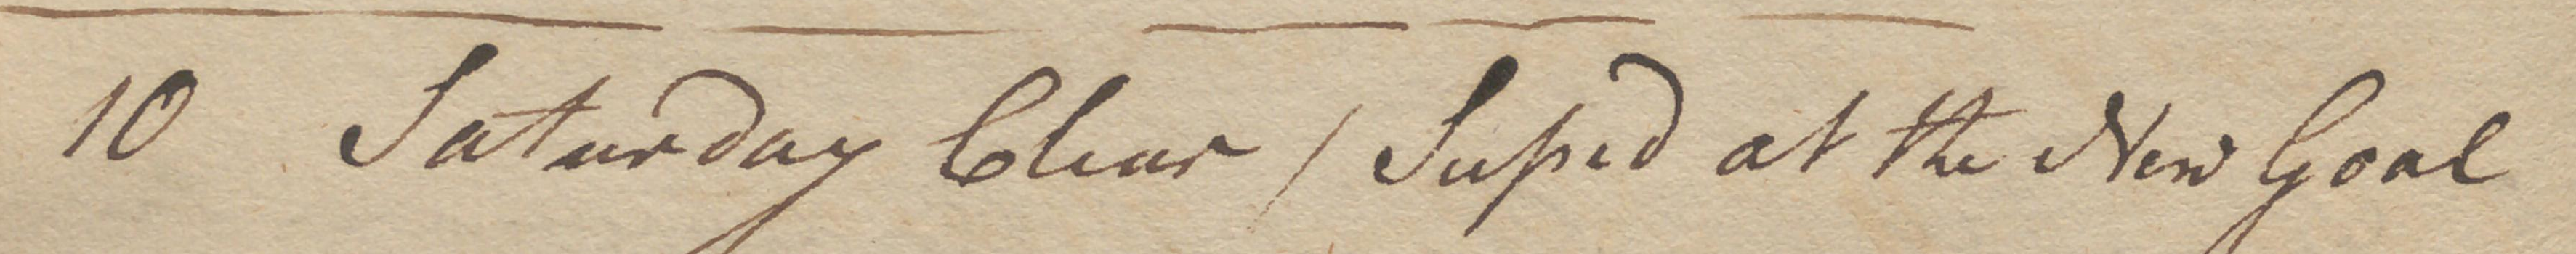10 Saturday Clear / Suped at the New Goal
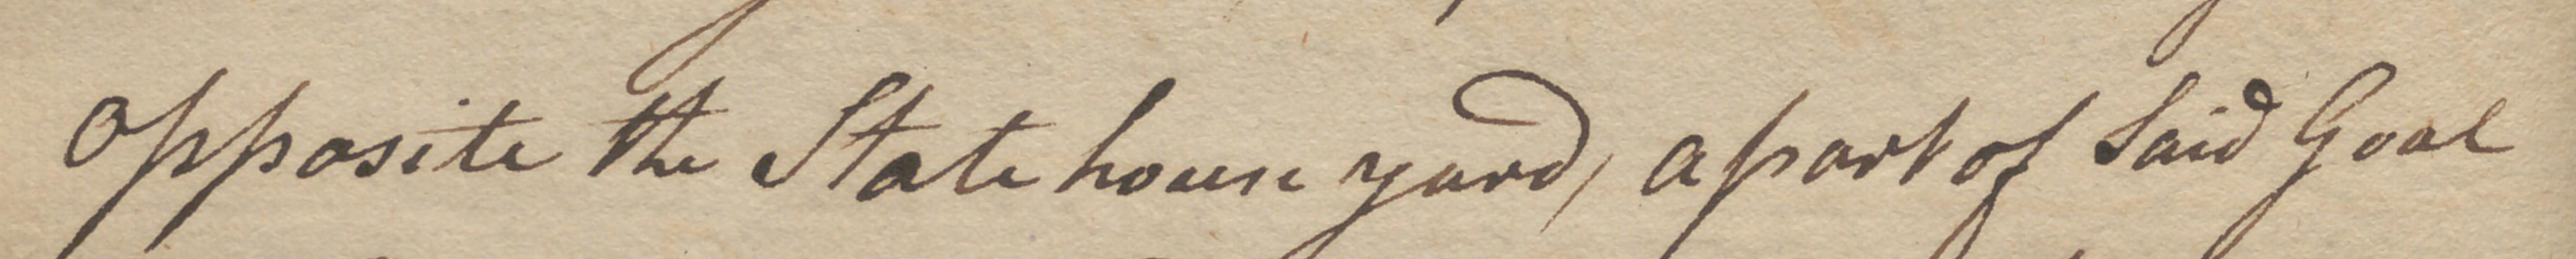opposite the State house yard, a part of Said Goal
